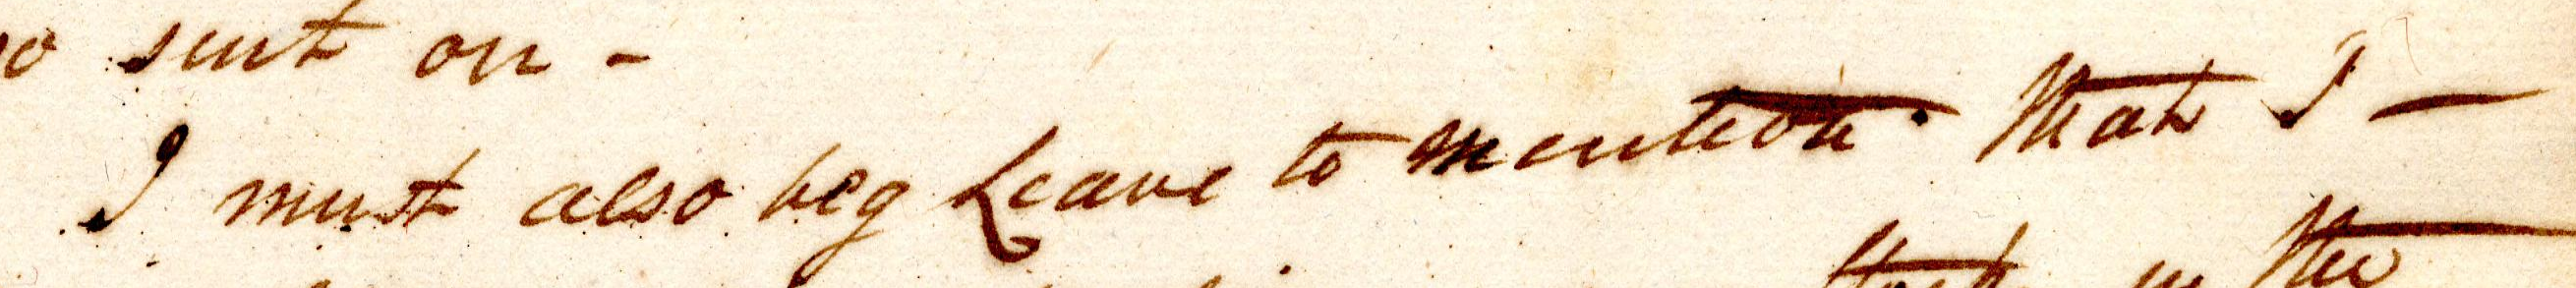I must also beg Leave to mention that I
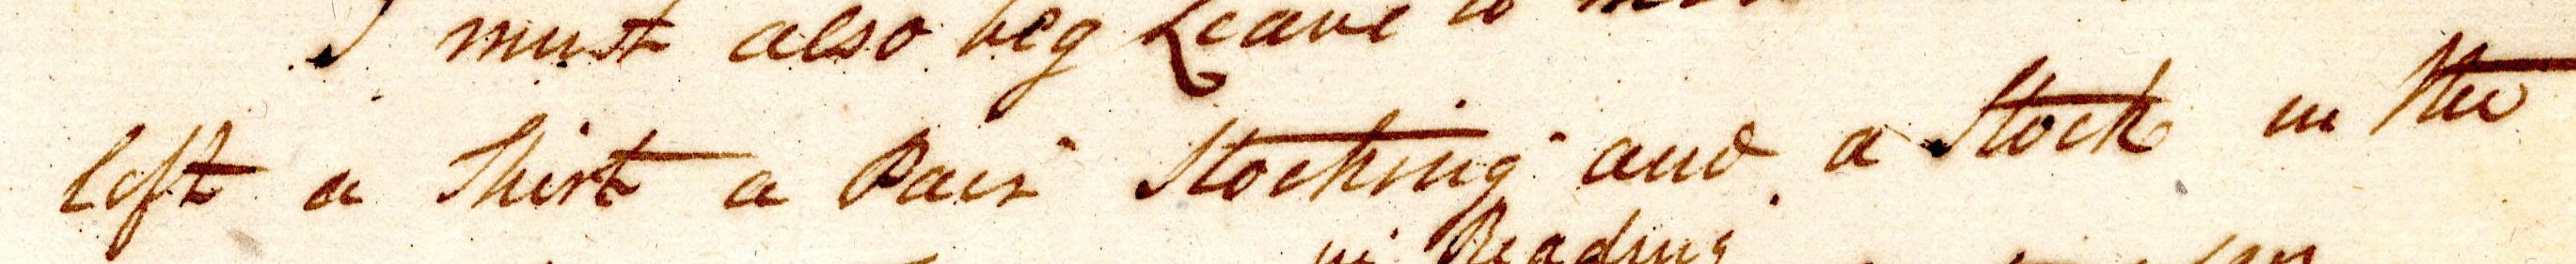left a shirt a Pair stocking and a Stock in the
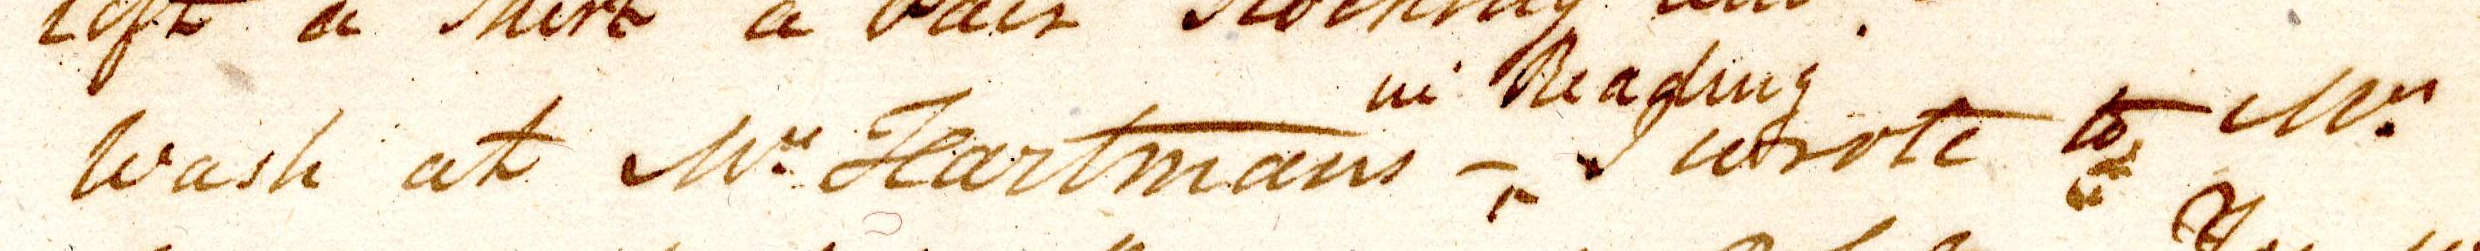wash at M^rs. Hartmans ^ I wrote to M^r.
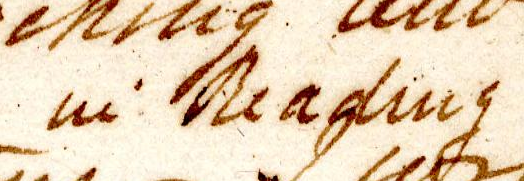in Reading
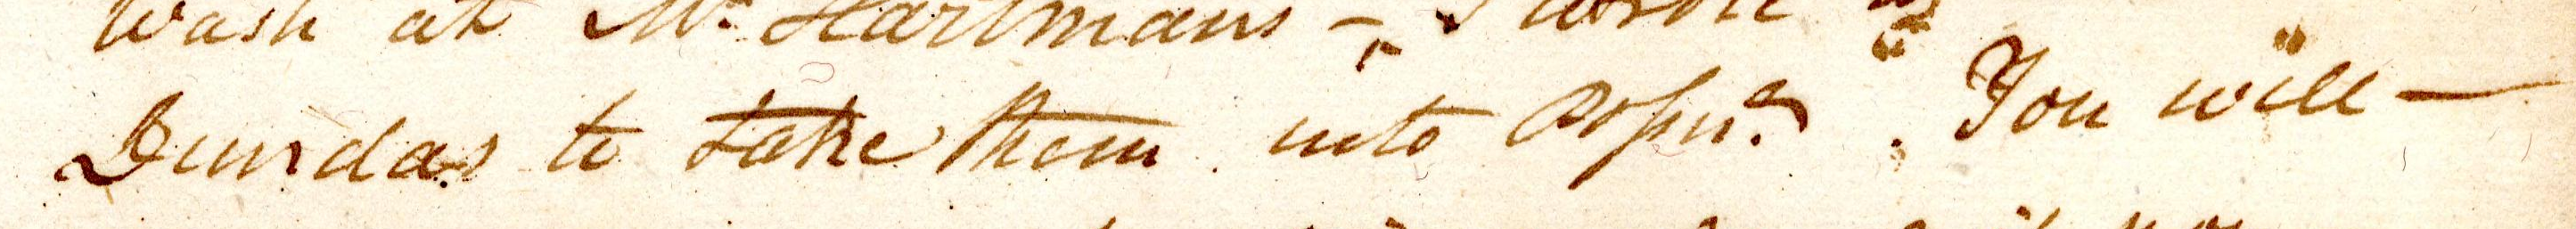Dundas to take them, into Poss^n. You will
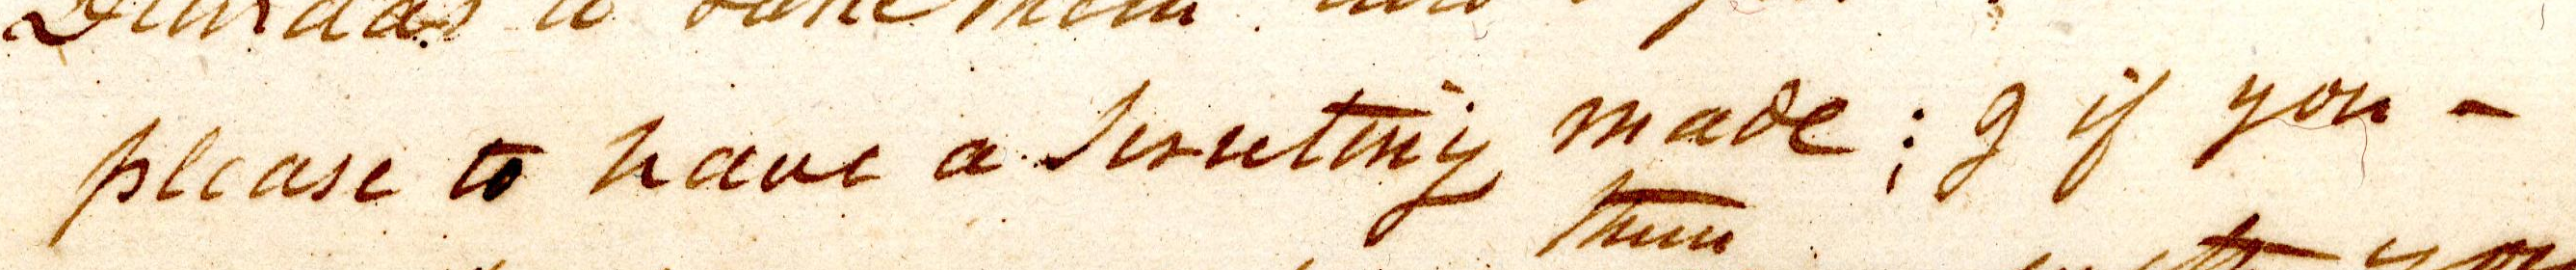please to have a Sereutiny made; & if you
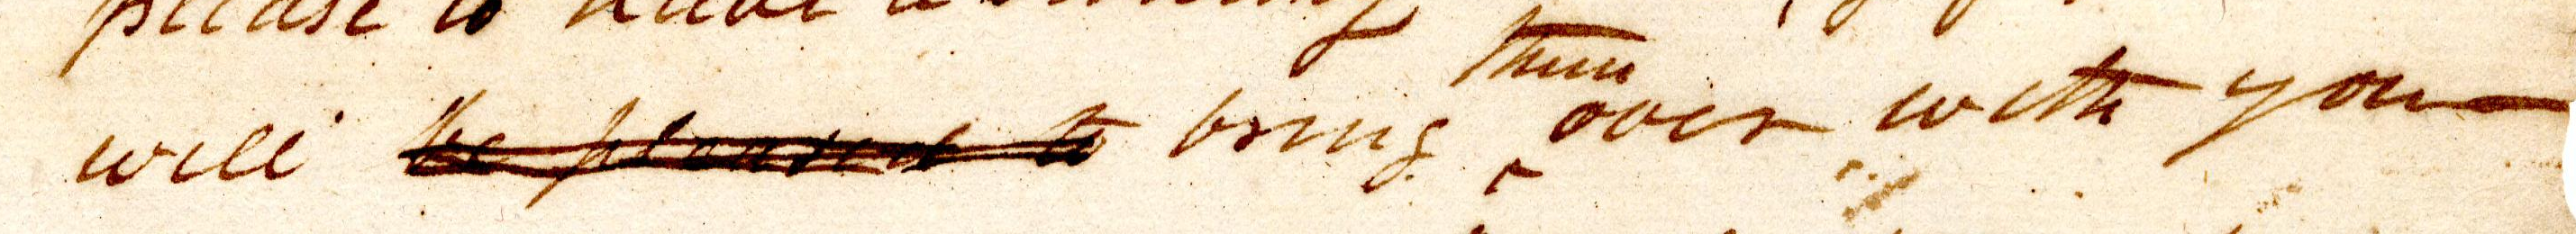will be pleased to bring ^ over with you
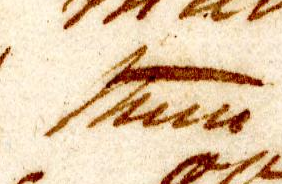them
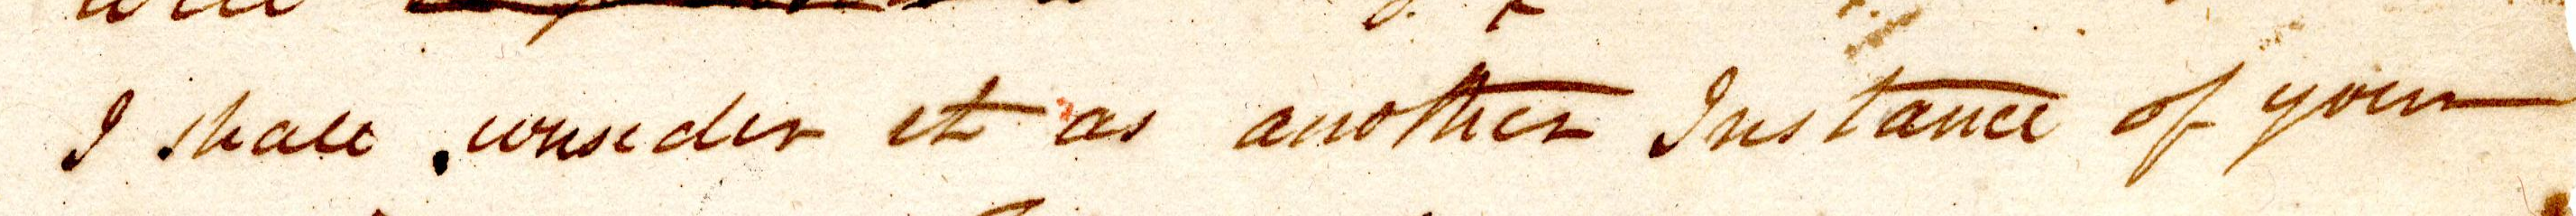I shall consider it as another Instance of your
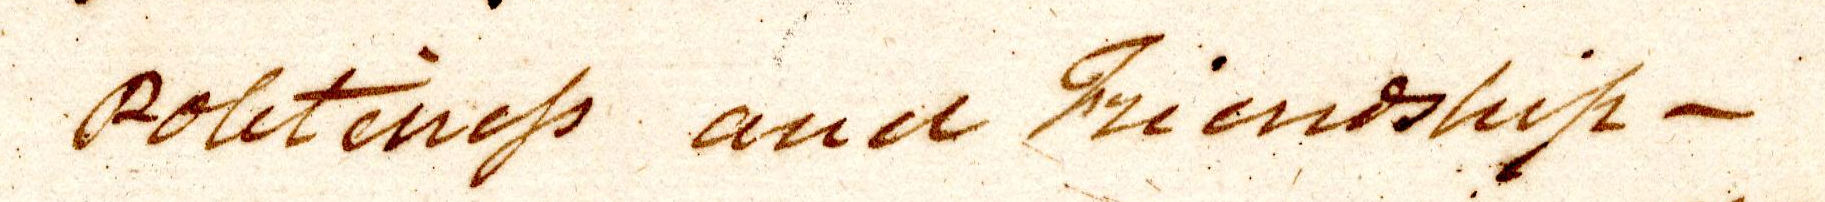Politeness and Friendship.
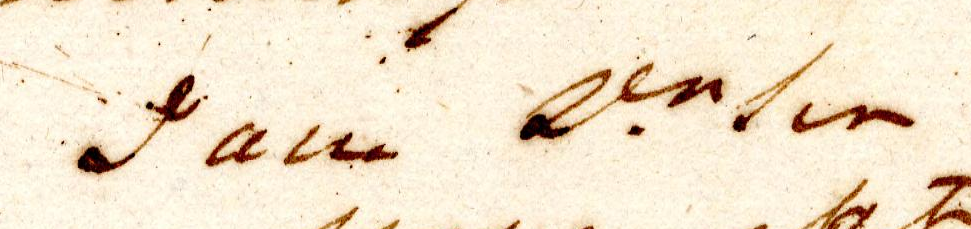I am D^r Sir
